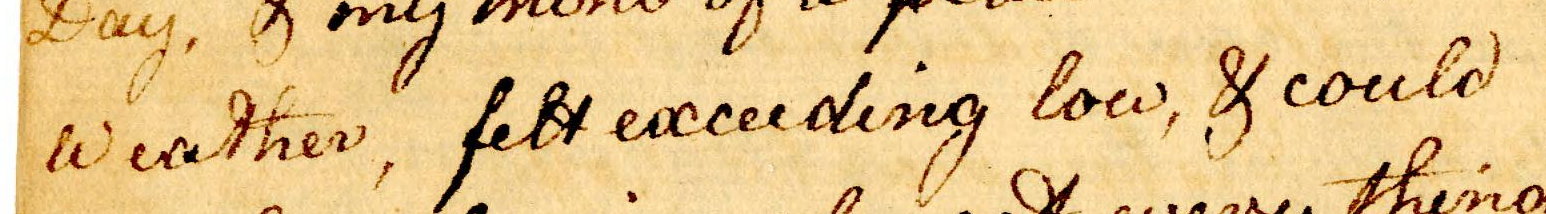Weather, felt exceeding low, & could
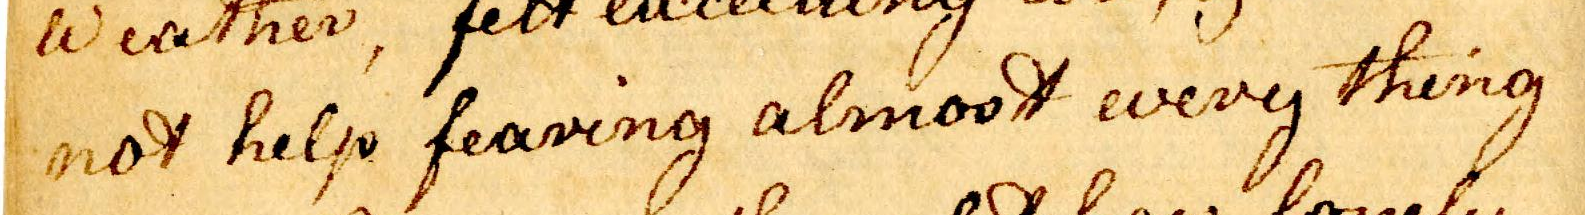not help fearing almost every thing
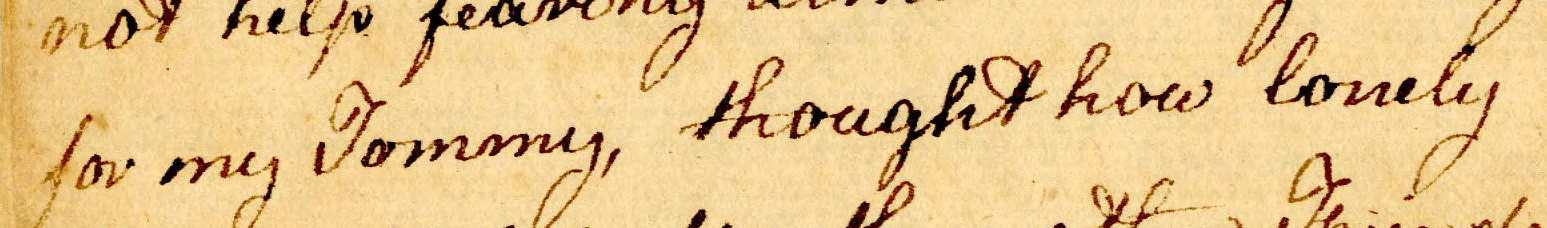for my Tommy, thought how lonely
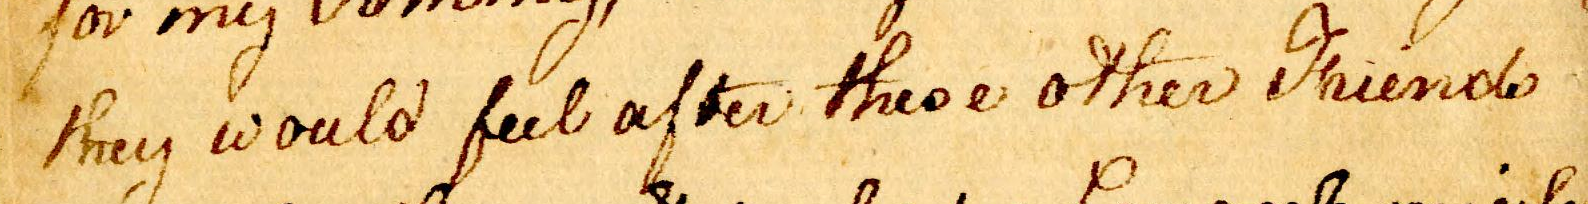they would feel after these other Friends
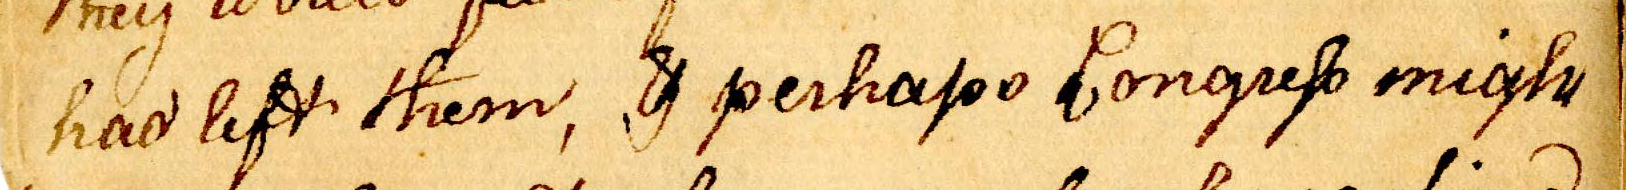had left them, & perhaps Congress might
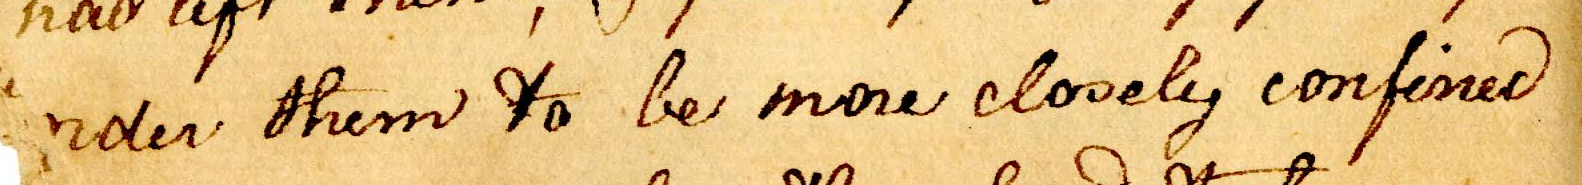order them to be more closely confined
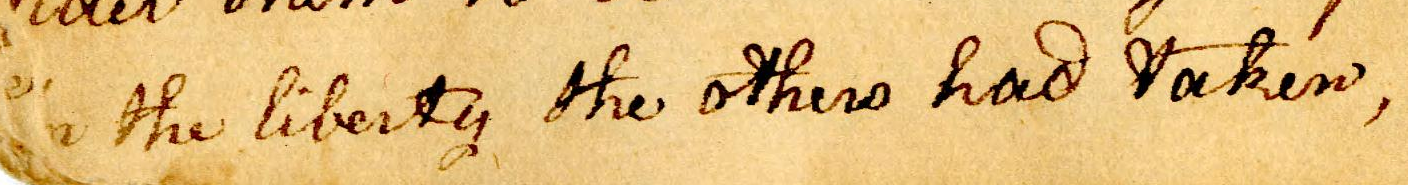the liberty the others had taken,
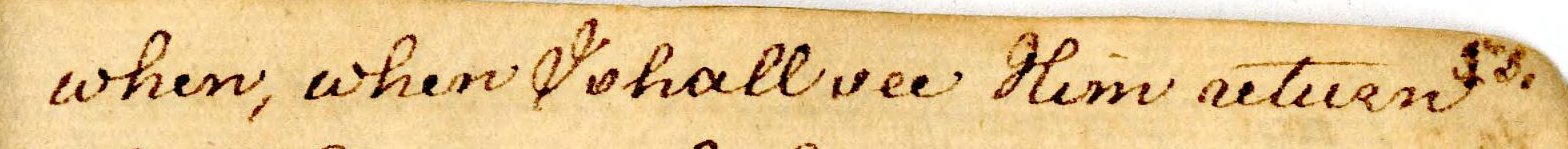when, when I shall see Him return
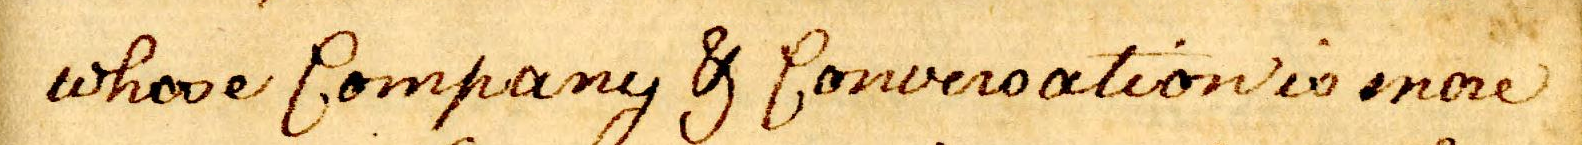whose Company & Conversation is more
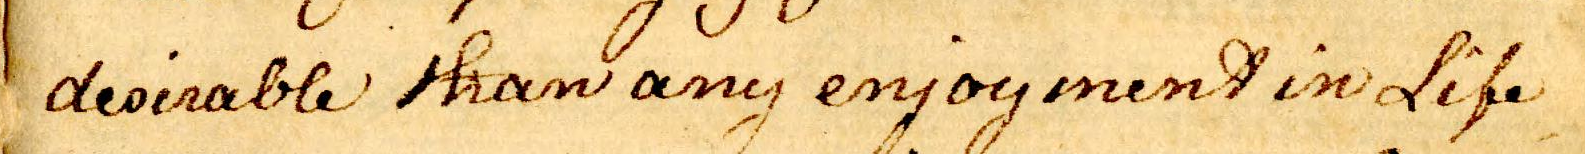desirable than any enjoyment in Life
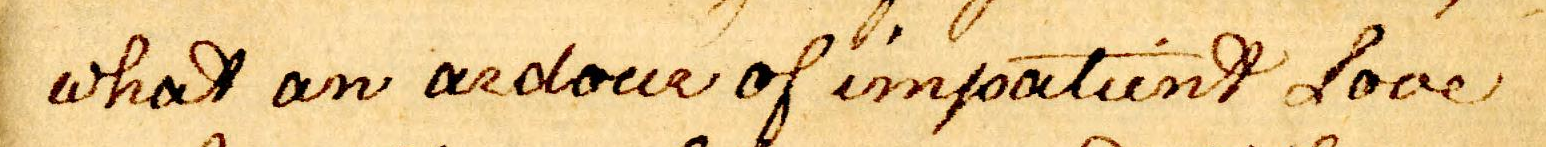what an ardour of impatient Love
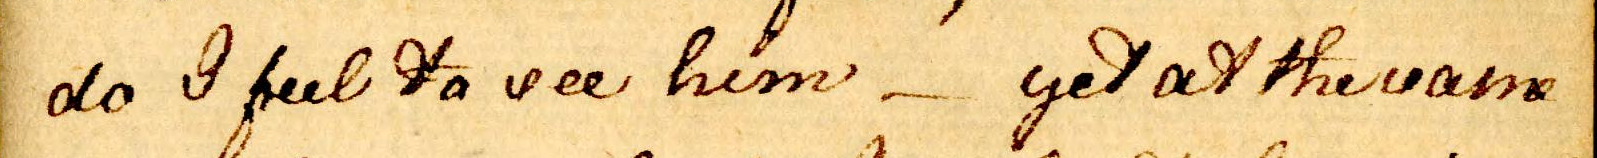do I feel to see him- yet at the same
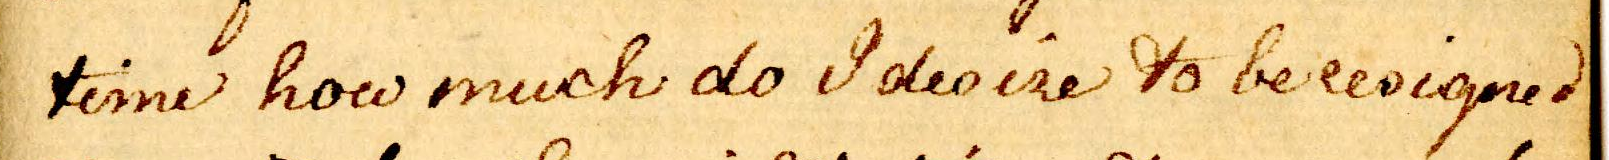time how much do I desire to be resigned
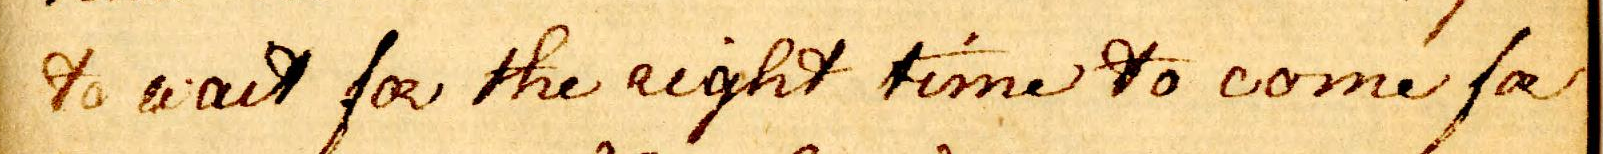to wait for the right time to come for
